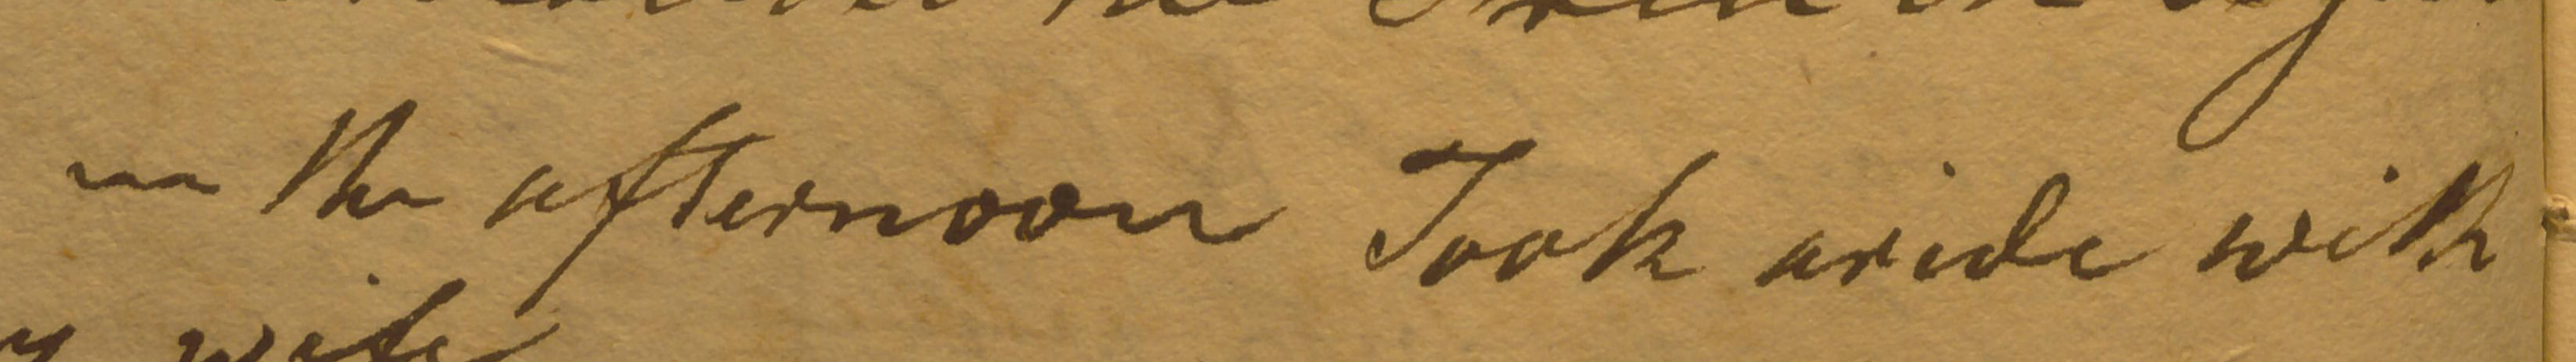the afternoon Took a ride with
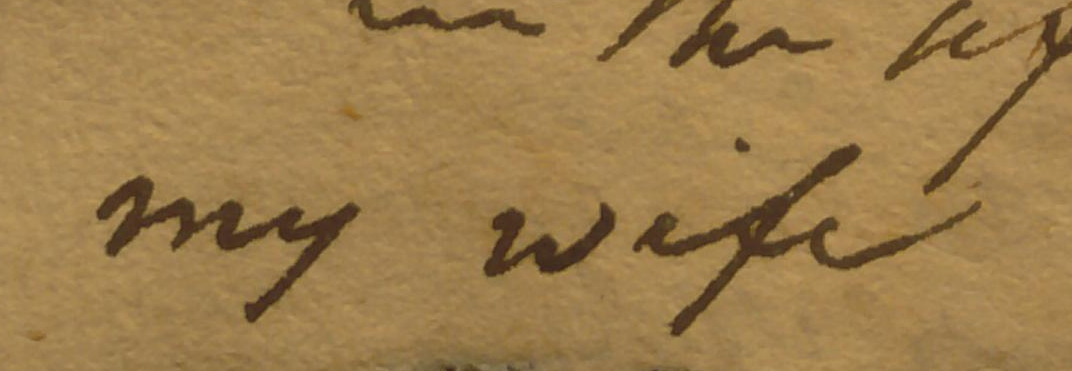my wife
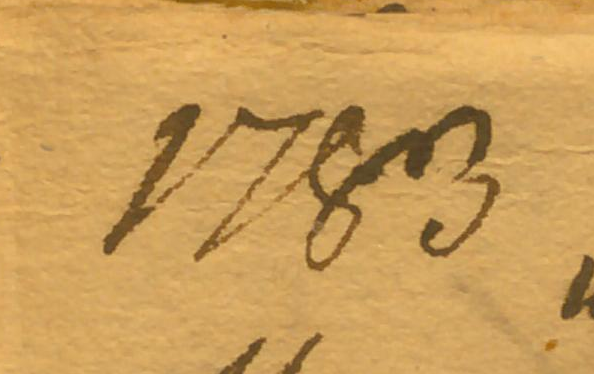1783
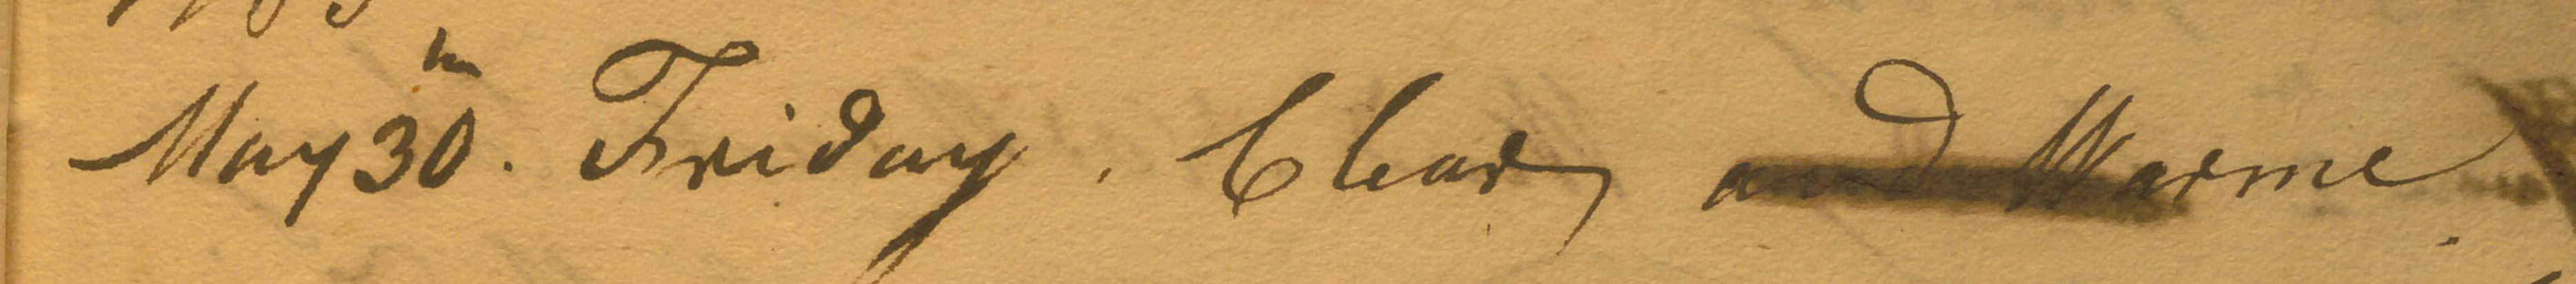May 30^th. Friding. Clear and Warme
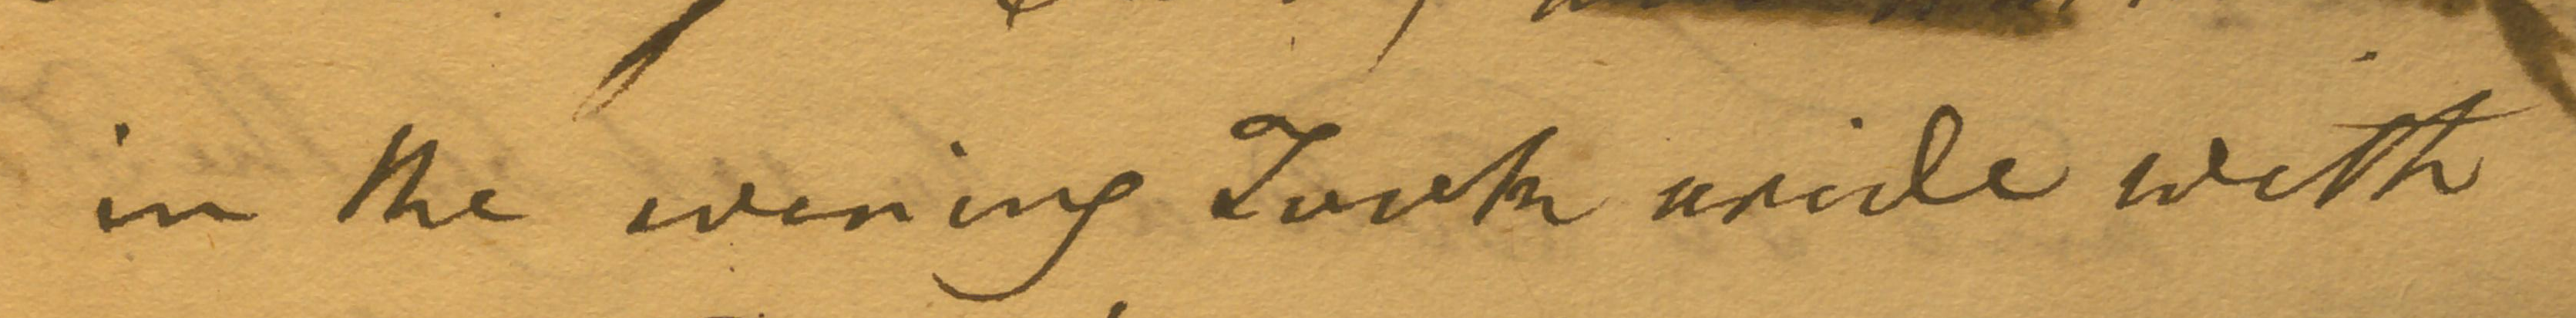in the evening Took a ride with
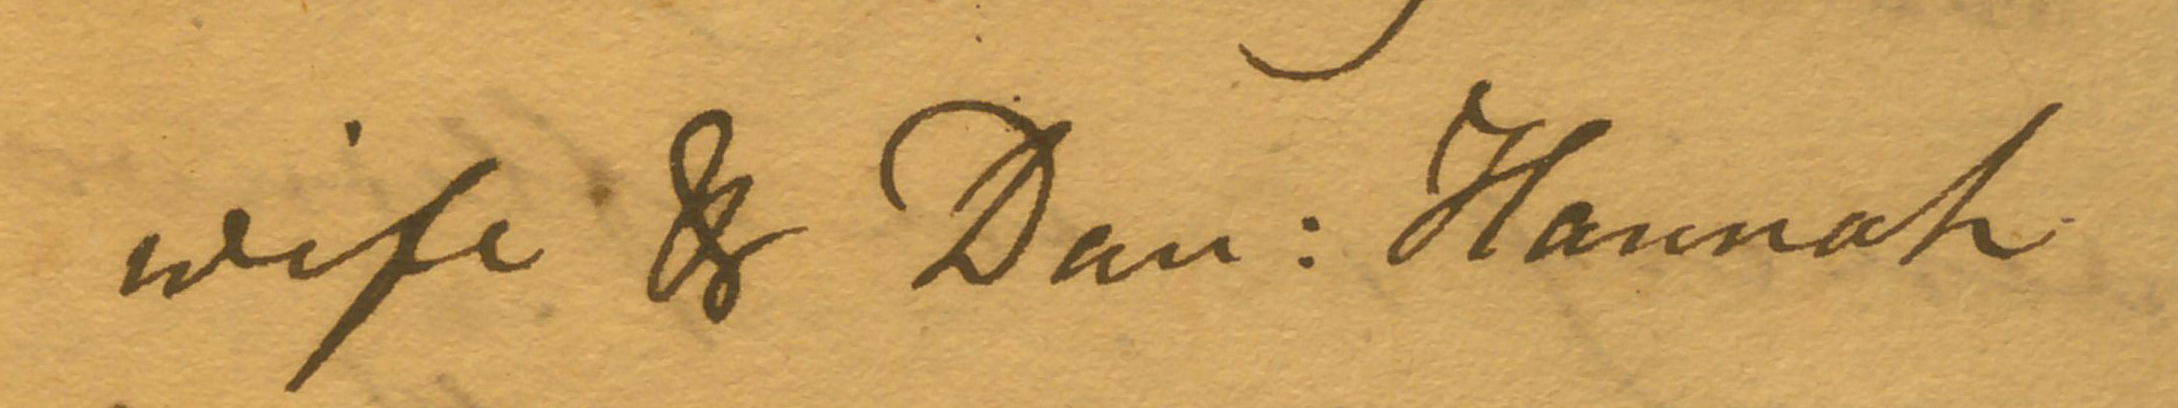wife & Dau: Hannah
